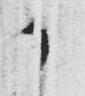人
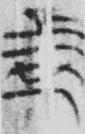者
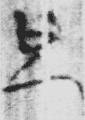也
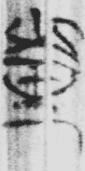釐（赉）
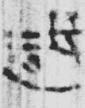武
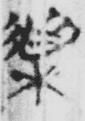樂
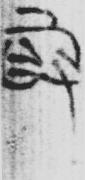取
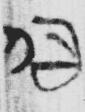卲（韶）
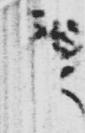○（夏）
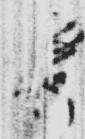○（樂）
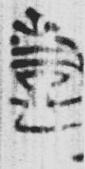情
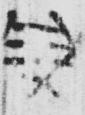凡
